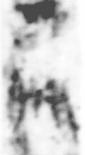安
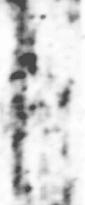車
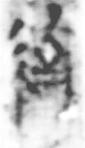紫
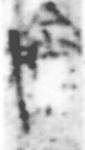○（錦）
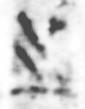之
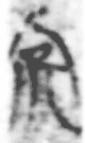安（鞍）
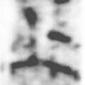上
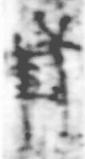軒
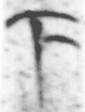下
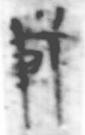軒
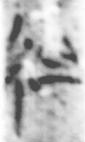○（組）
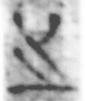之
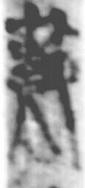○（綴）
